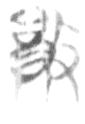敗（敗）
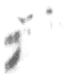亓（其）
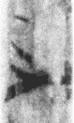之
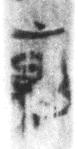厠
